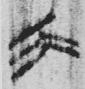帀（師）
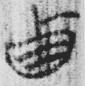貞
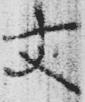丈
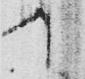人
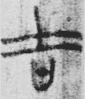吉
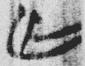亡（无）
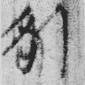咎
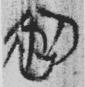初
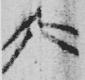六
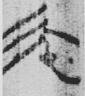帀（師）
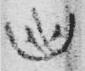出
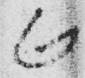㠯（以）
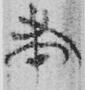聿（律）
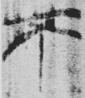不
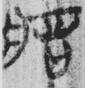○（臧）
